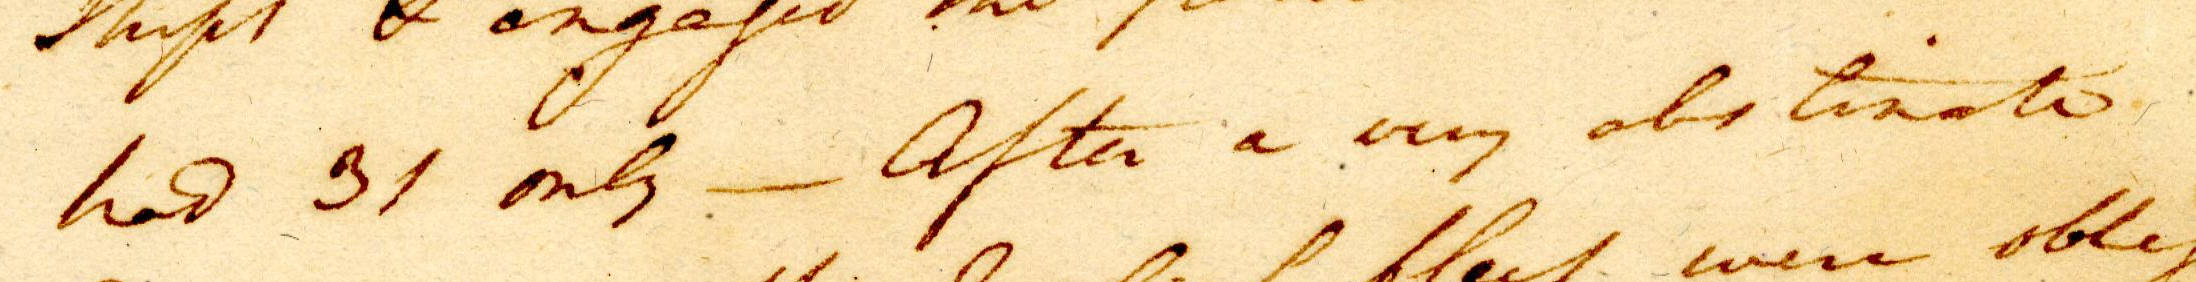had 31 only. After a very obstinate
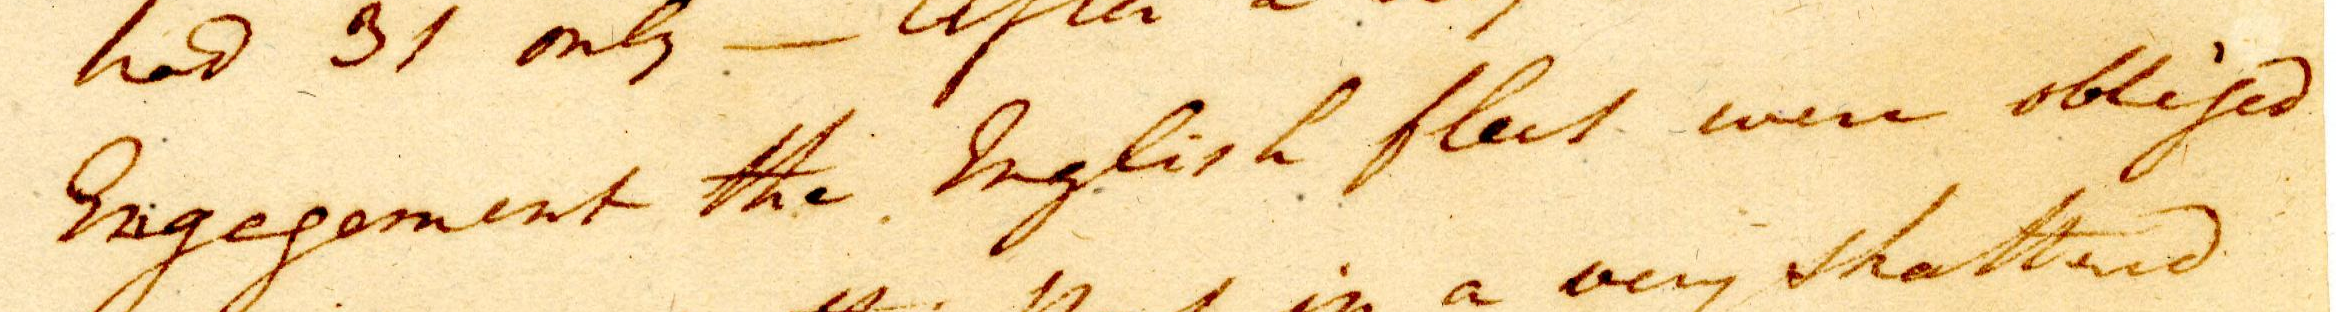Engagement the English fleet were obliged
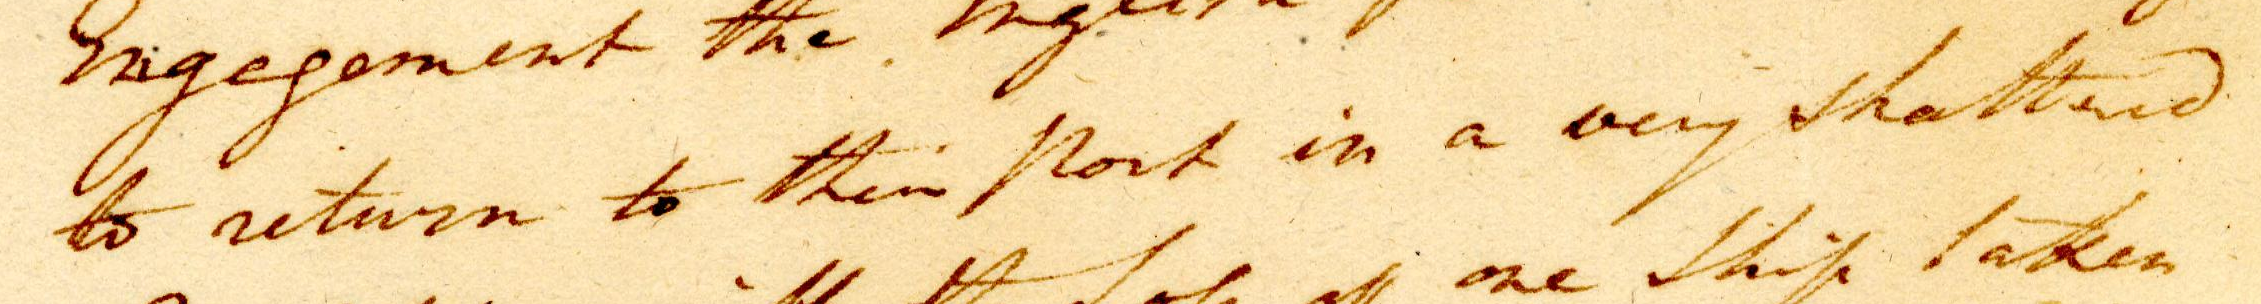to return to their port in a very shattered
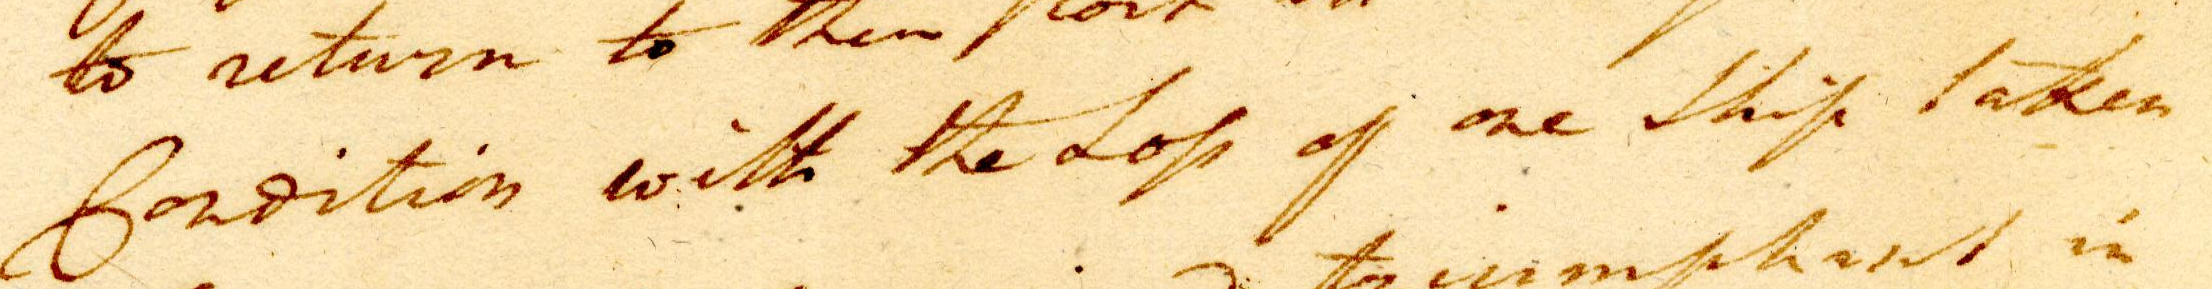Condition with the Loss of one Ship taken
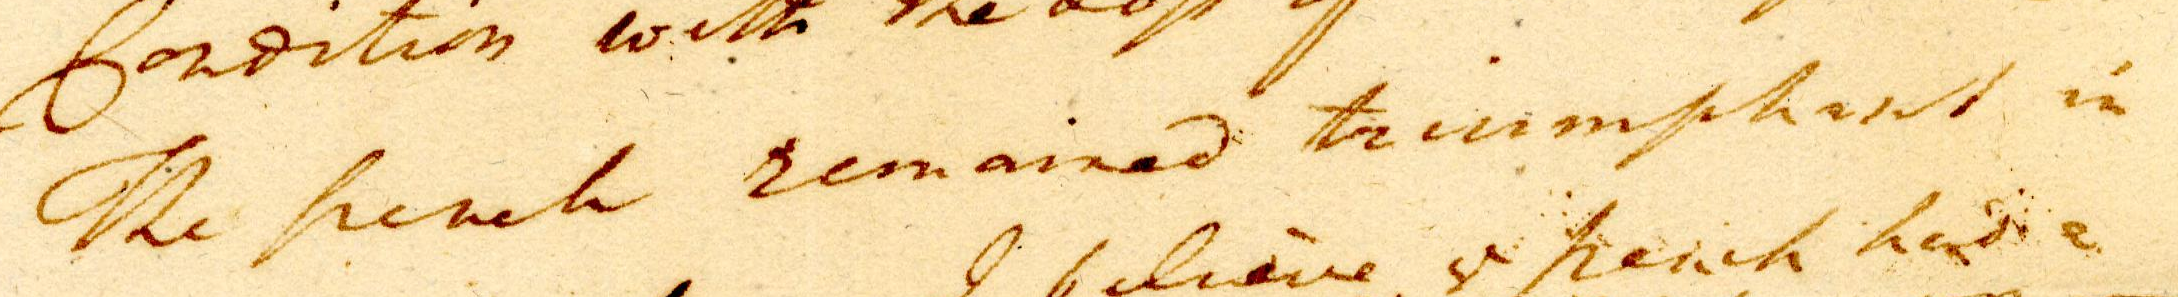The French remained triumphant in
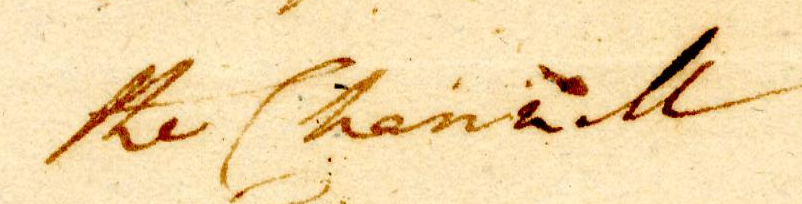the Channell
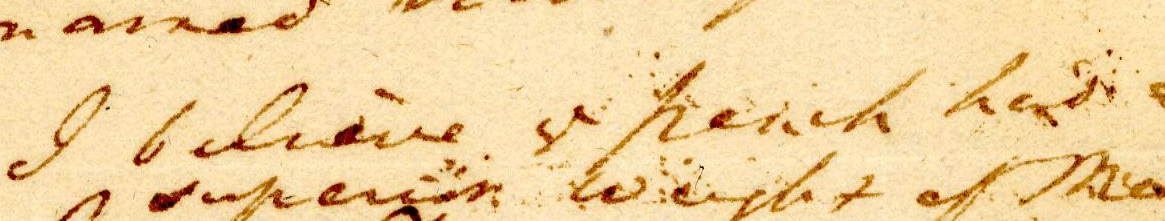I believe y^e French had
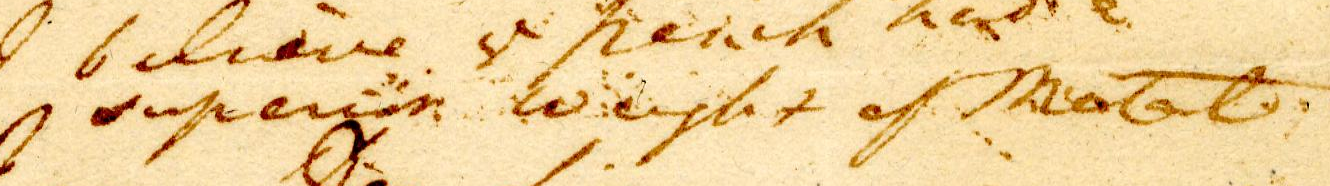superior weight of Metal
